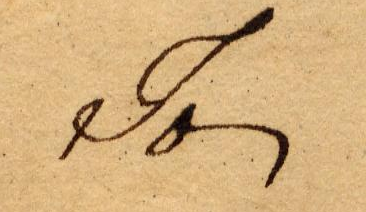To
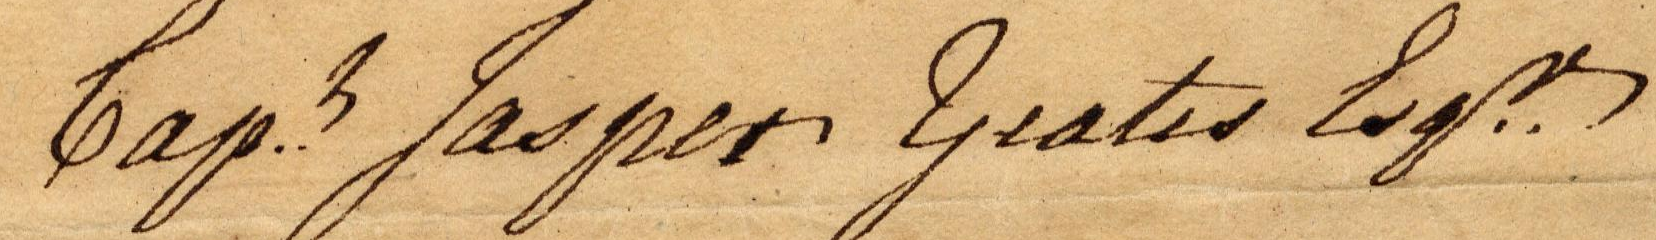Cap^n. Jasper Yeates Esq.
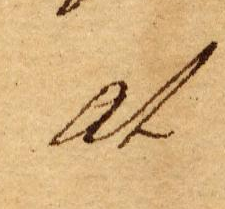At
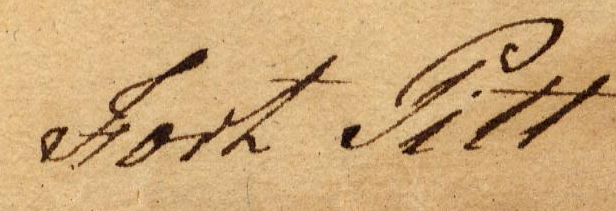Fort Pitt
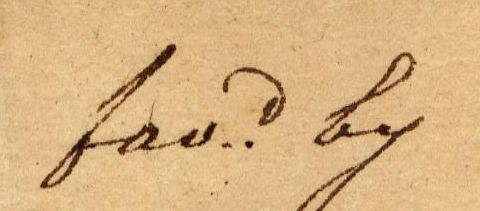fav^d. by
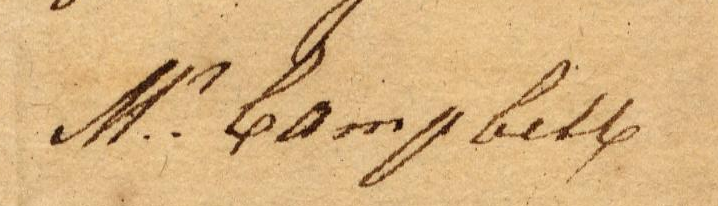M^r. Campbell
